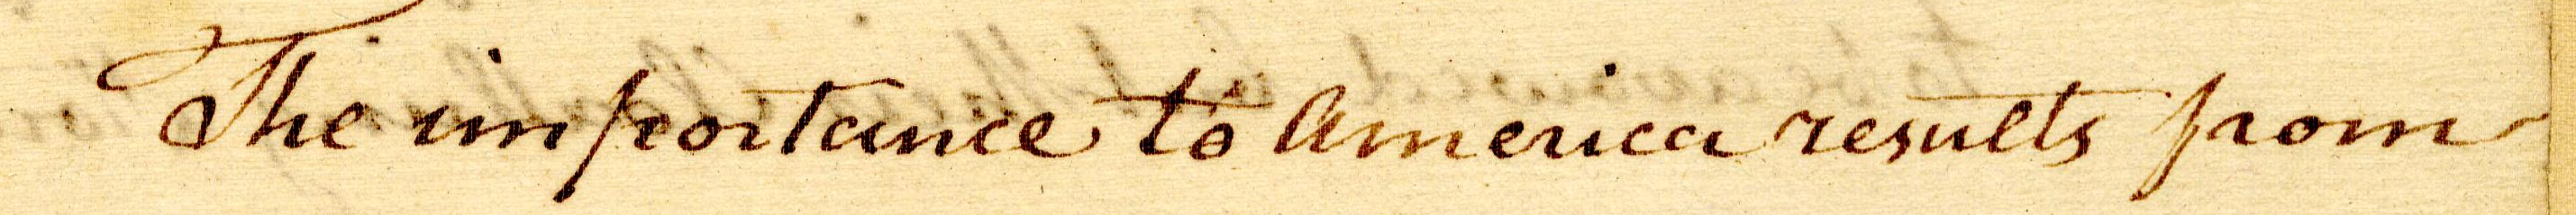The importance to America results from
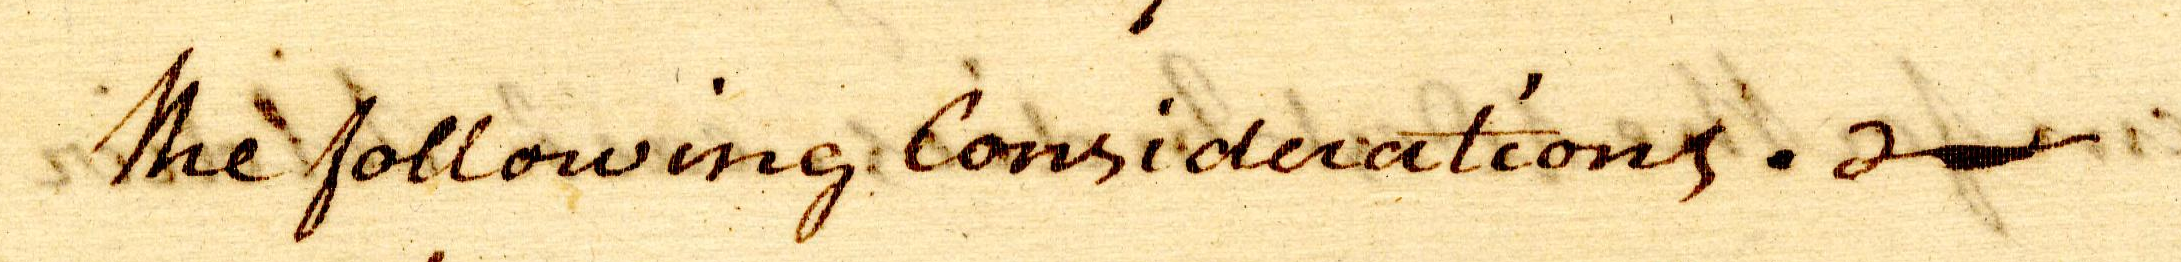the following Considerations. -
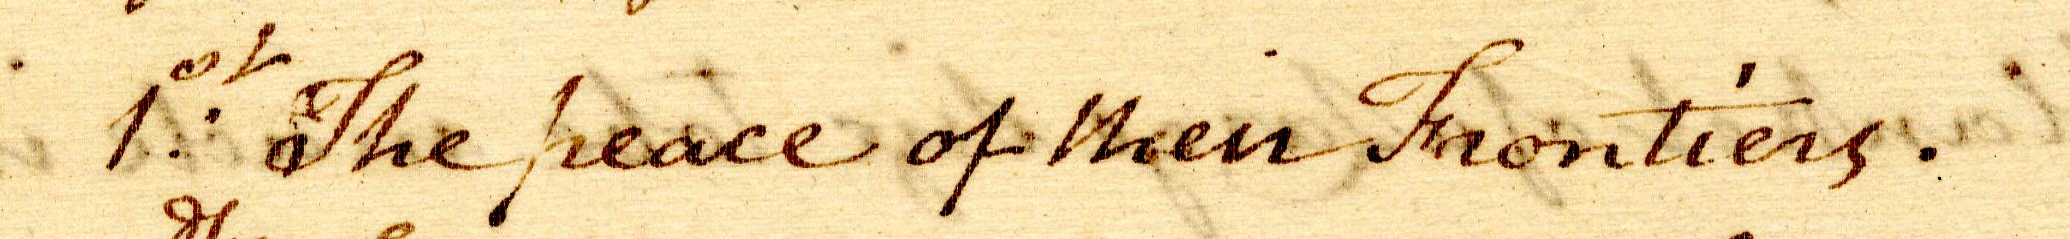1^st: The peace of their Frontiers.
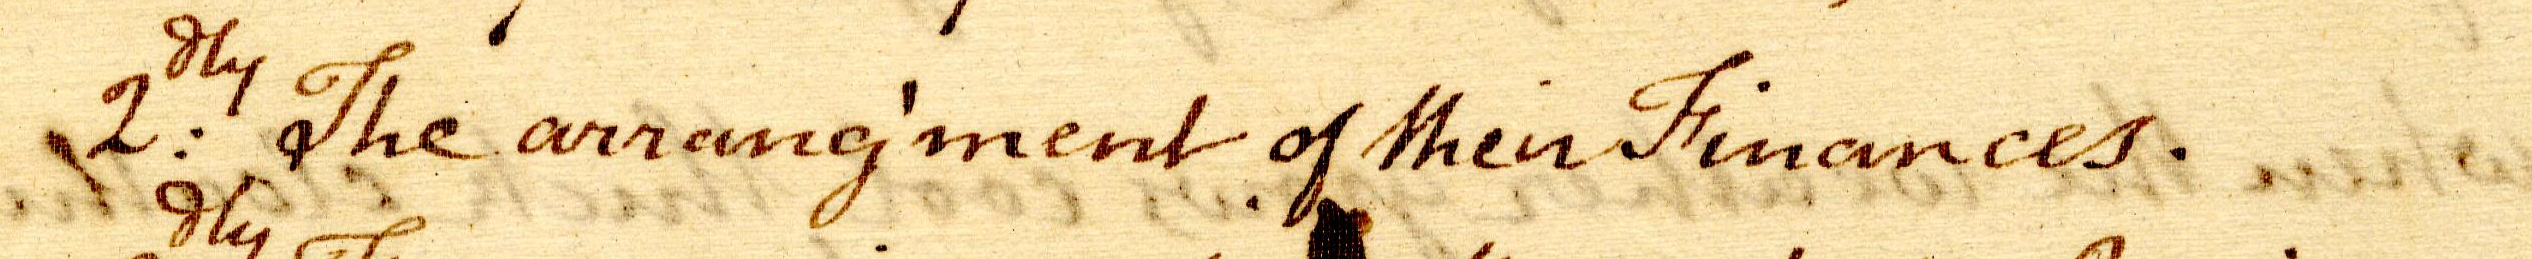2^dly: The arrang'ment of their Finances.
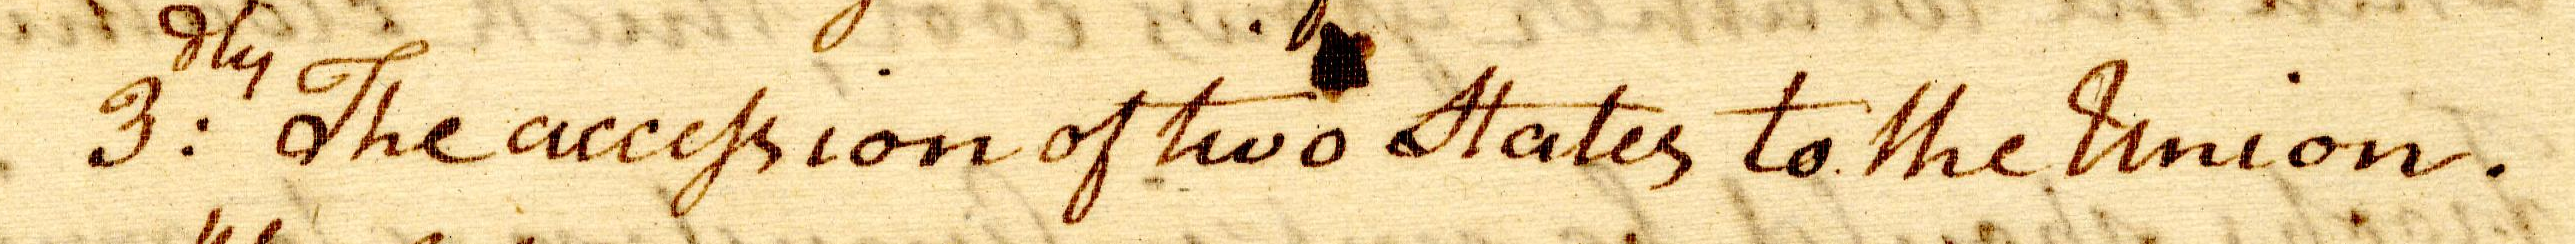3^dly: The accession of two States to the Union.
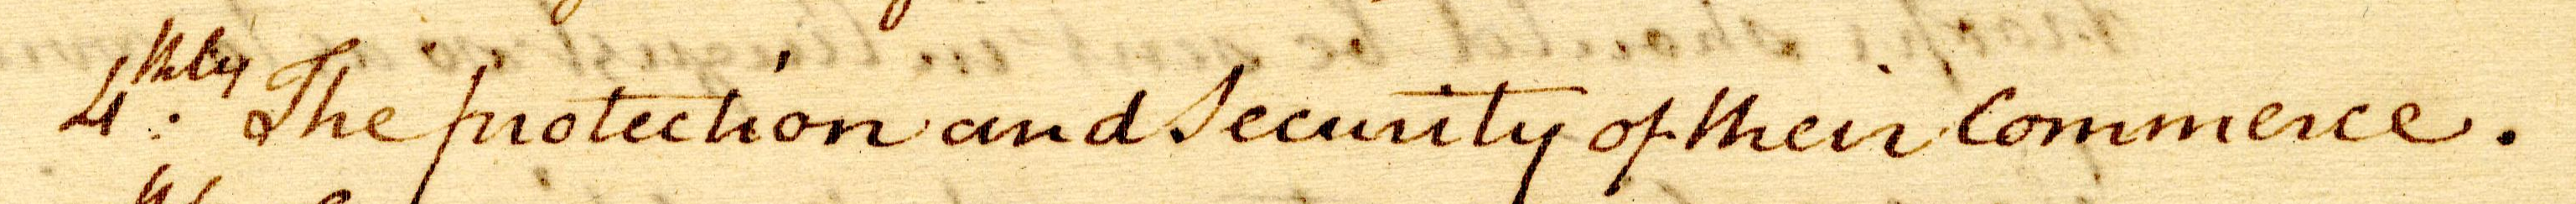4^thly: The protection and Security of their Commerce.
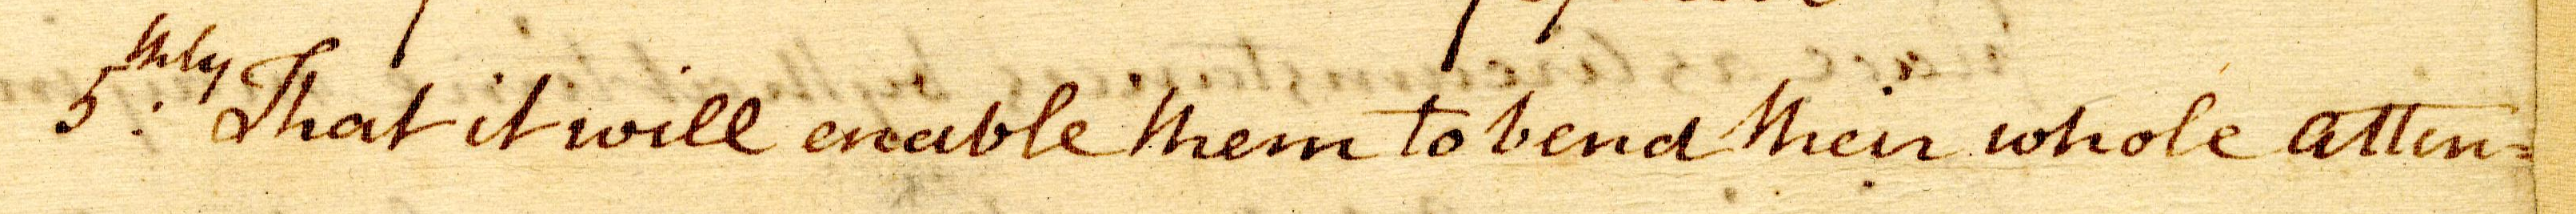5^thly: That it will enable them to bend their whole Atten-
